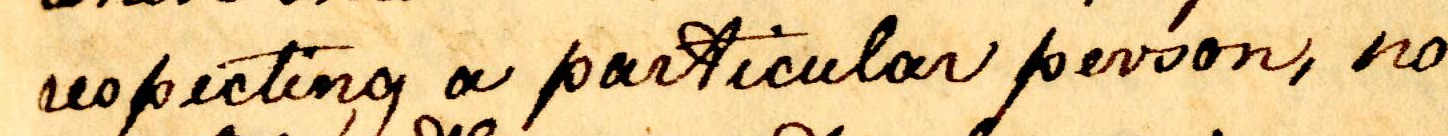respecting a particular person, no
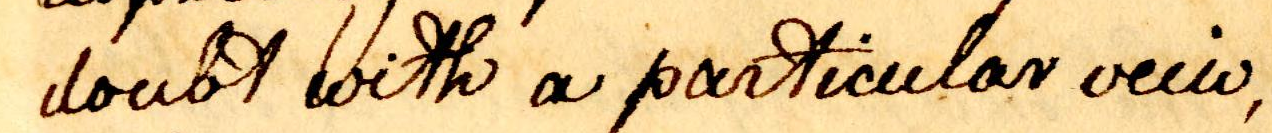doubt with a particular veiw,
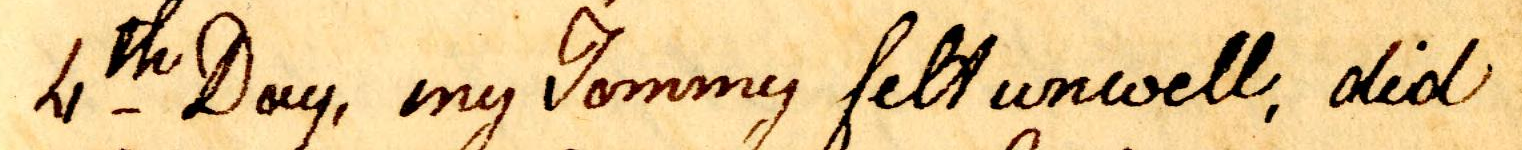4^th Day, my Tommy felt unwell, did
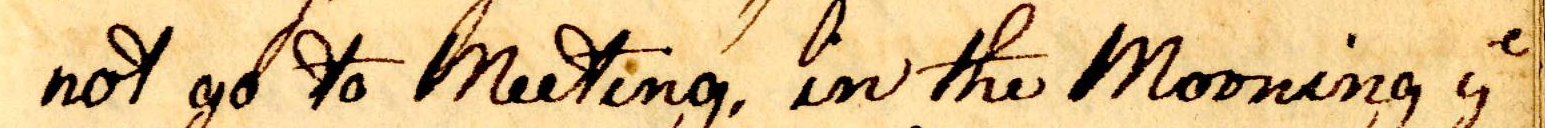not go to Meeting, in the Morning y^e
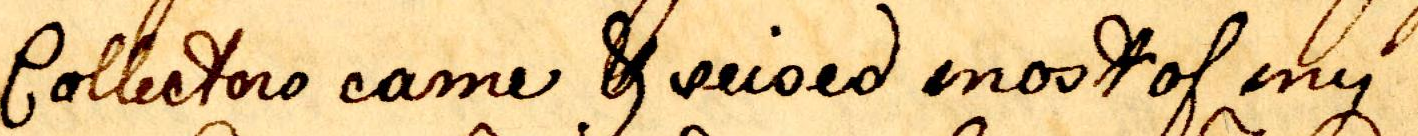Collectors came & seised most of my
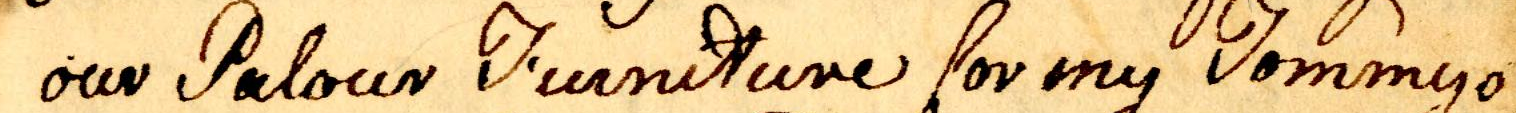our Palour Furniture for my Tommys
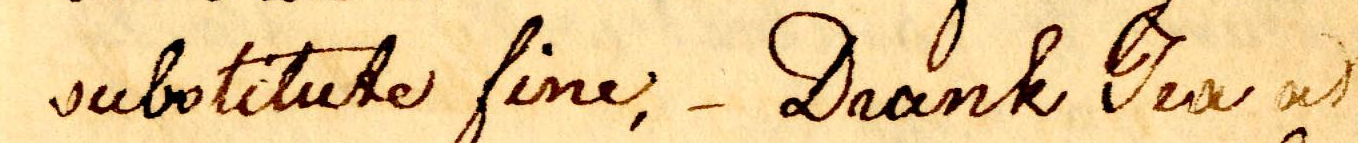substitute fine,- Drank Tea at
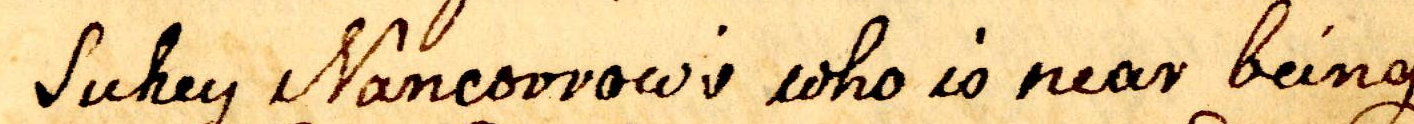Sukey Nancorrows who is near being
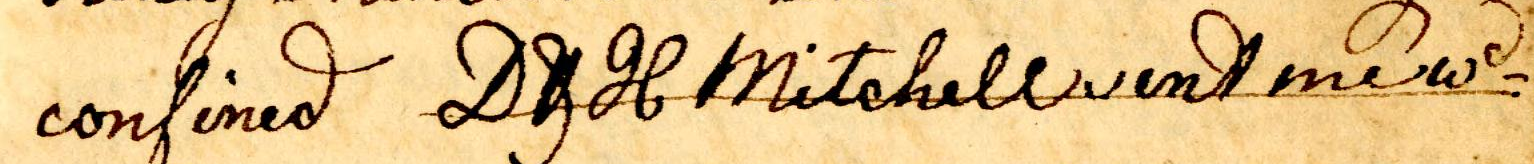confined D&H Mitchell sent me w^d-
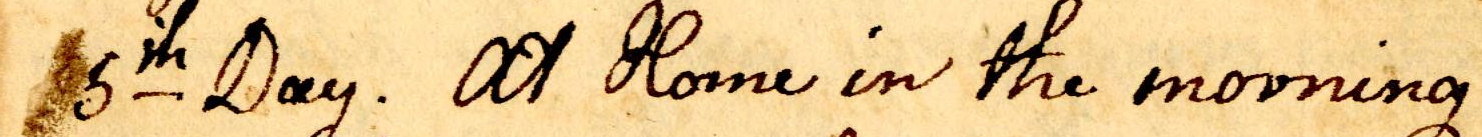5^th Day. At Home in the morning
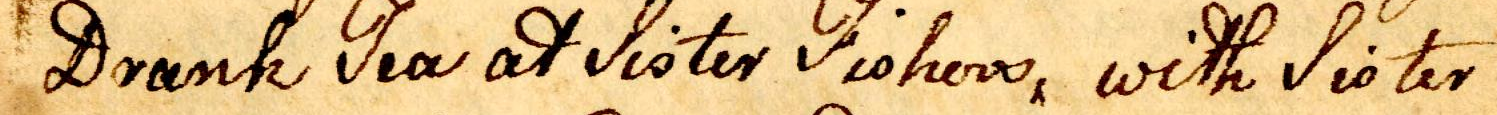Drank Tea at Sister Fishers, with Sister
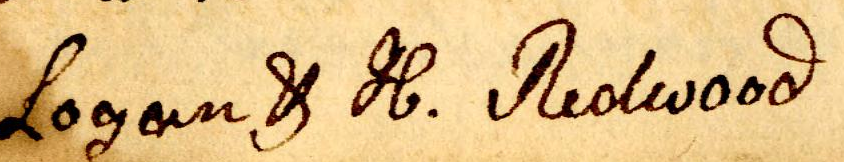Logan & H. Redwood
